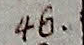46
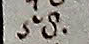58
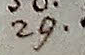29
